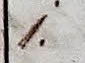1.
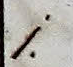1.
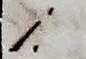1.
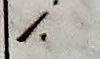1.
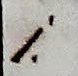1.
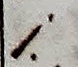1.
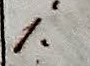1.
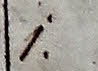1.
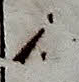1.
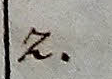2.
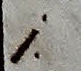1.
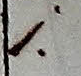1.
